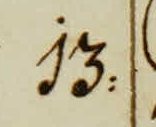13:
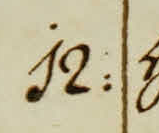12:
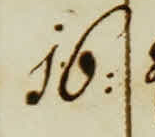16:
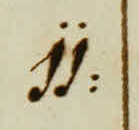11:
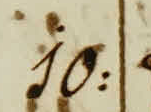10:
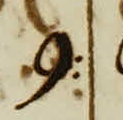9:
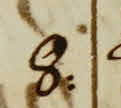8:
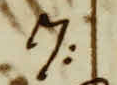7:
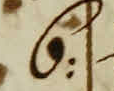6:
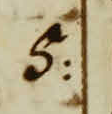5:
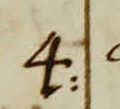4:
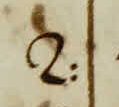2:
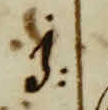1:
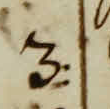3:
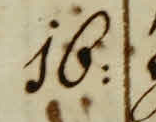16:
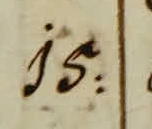15:
